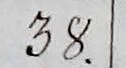38.
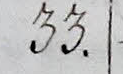33.
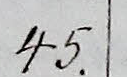45.
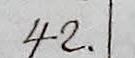42.
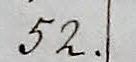52.
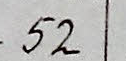52
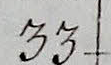33
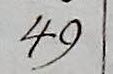49
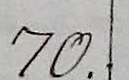70.
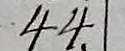44.
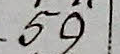59
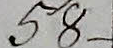58
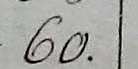60.
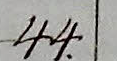44.
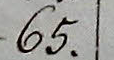65.
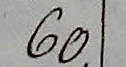60.
